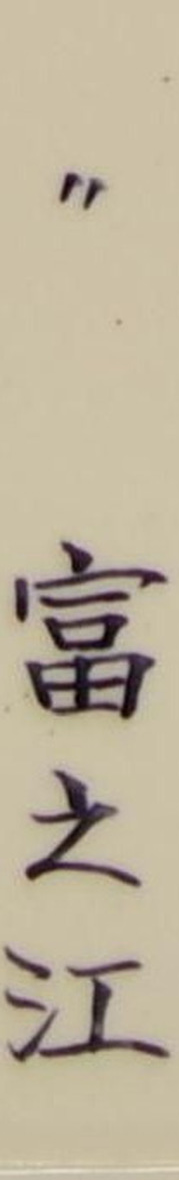富之江
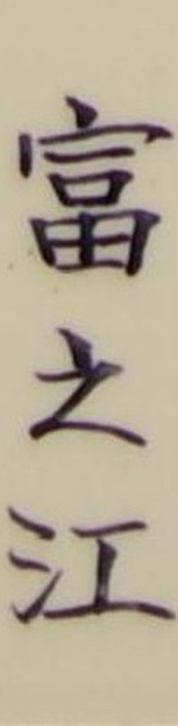富之江
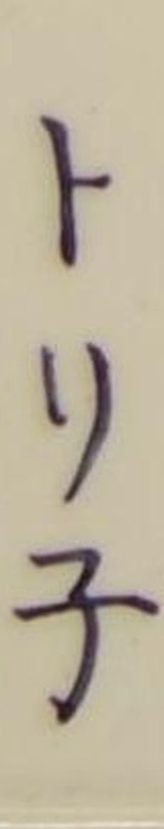トリ子
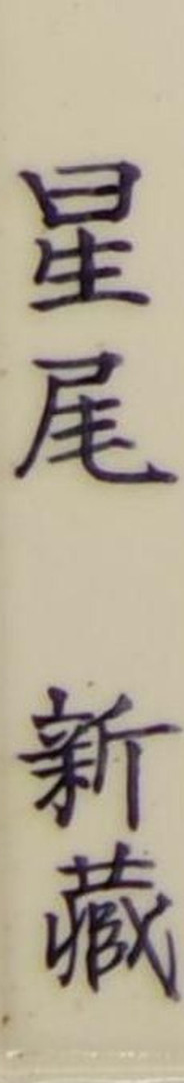星尾新蔵

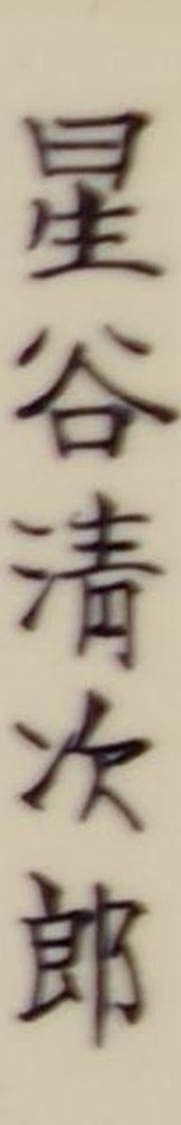星谷清次郎
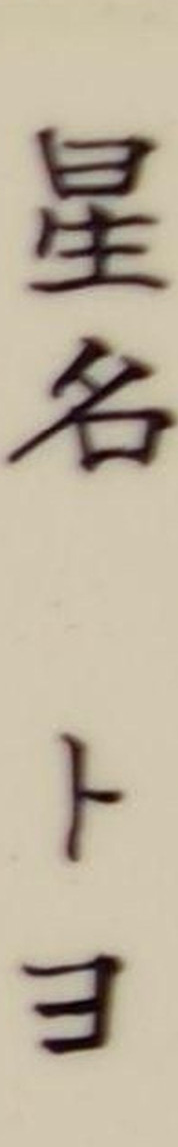星名トヨ
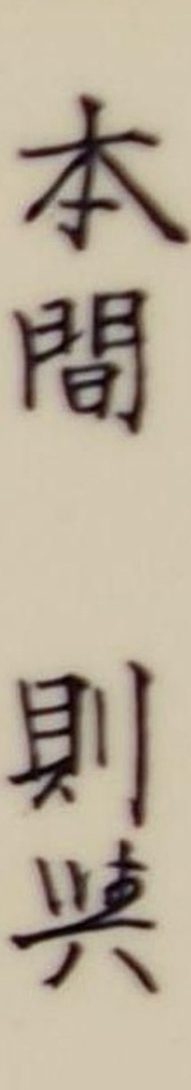本間則与
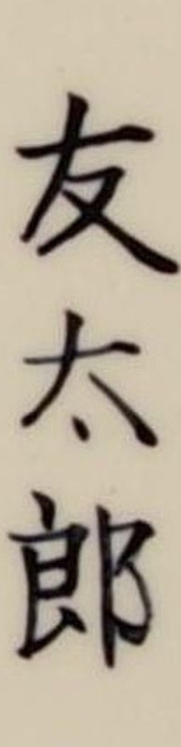友太郎
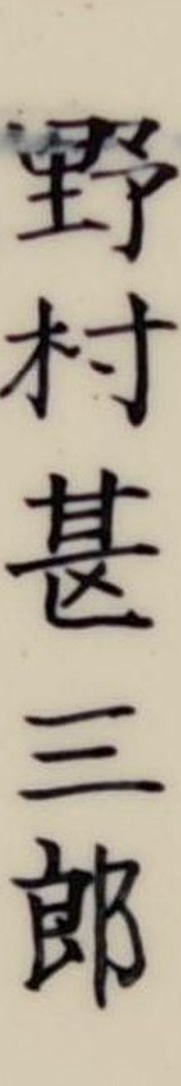野村甚三郎
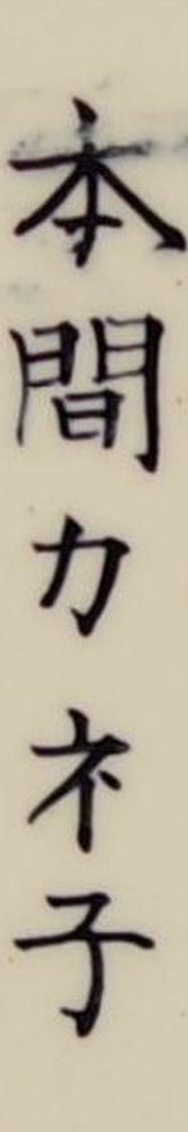本間カネ子
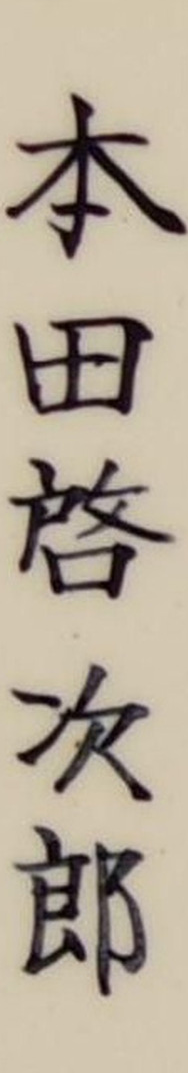本田啓次郎
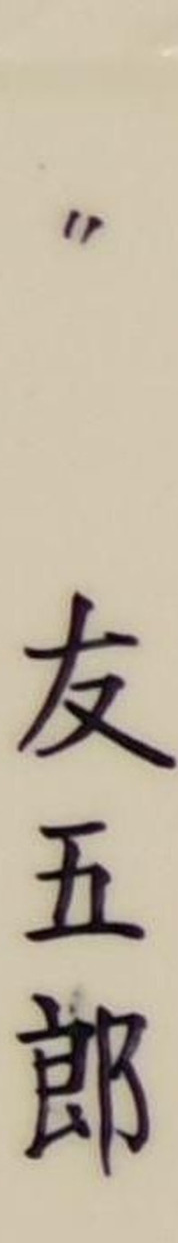友五郎
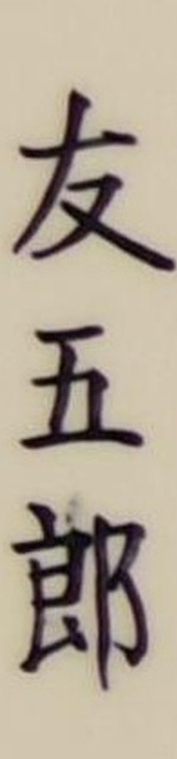友五郎
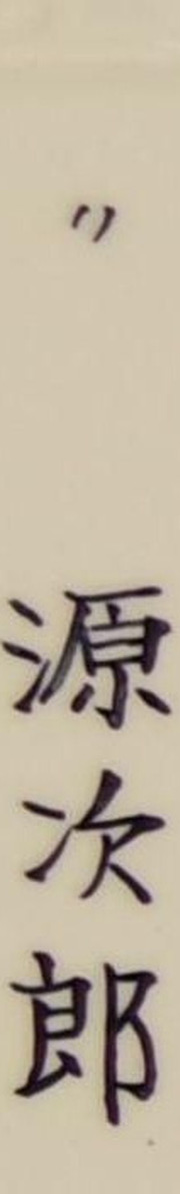源次郎
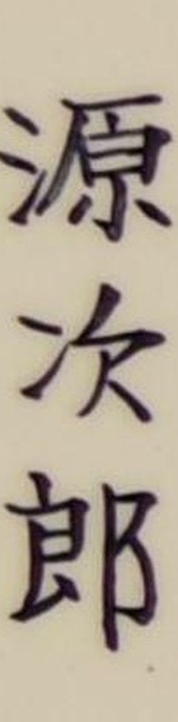源次郎
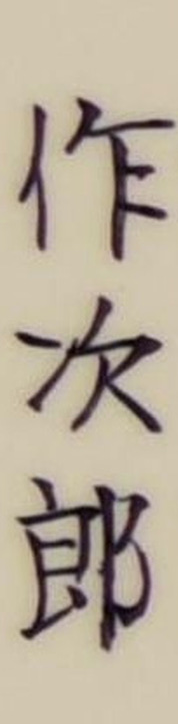作次郎
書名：A~D
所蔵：koyasan kongobuji
